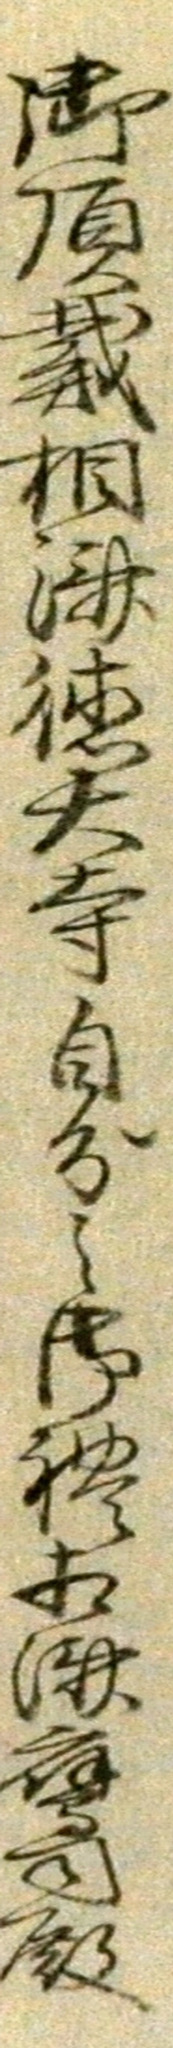御頂戴相済徳大寺自分之御礼相済鷹司殿
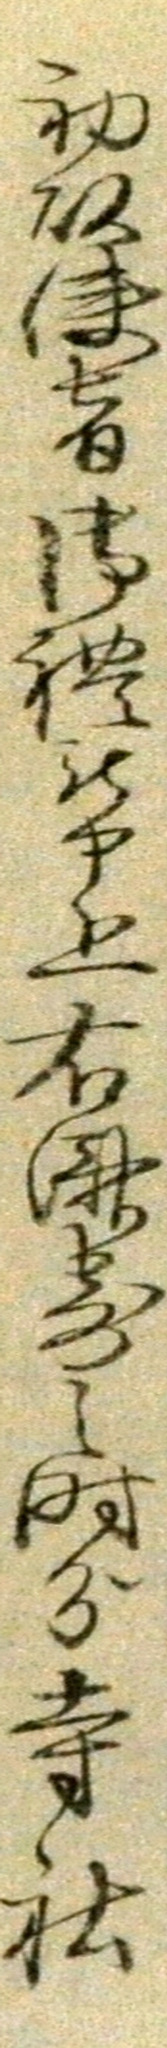初以使者後礼被申上右済寄之時分寺社
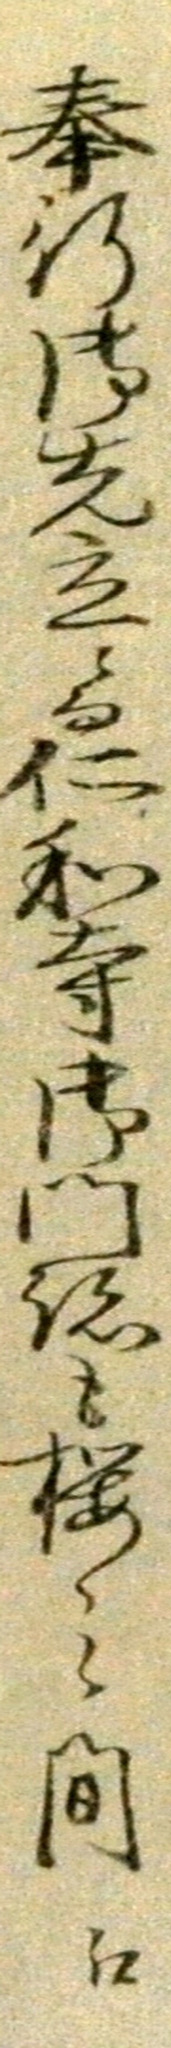奉行御先立ニ而仁和寺御門跡も桜之間え
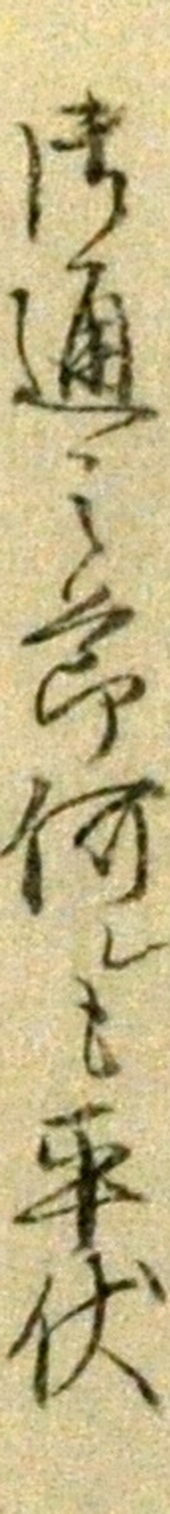御通之節何レも平伏
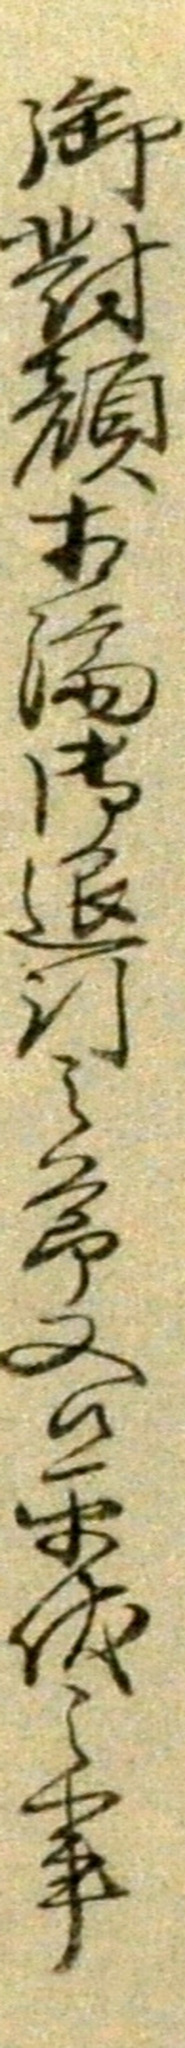御対顔相済御退引之節又候平伏之事
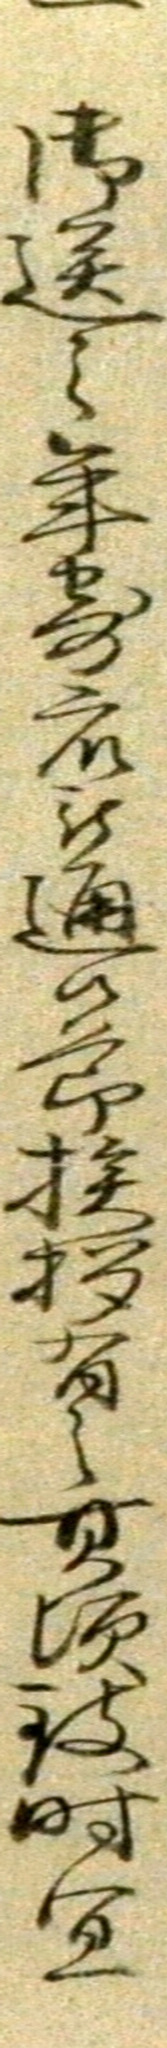一御送之年寄衆被通候節挨拶有之其頃致時宜
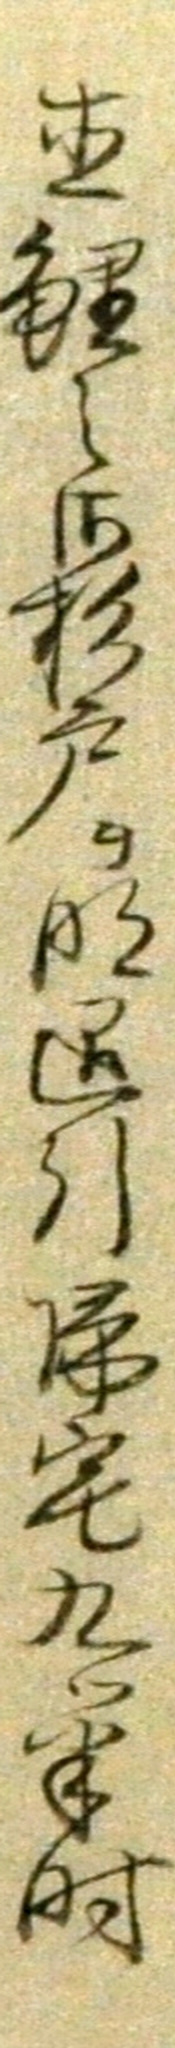直鯉之御杉戸ヲ明退引帰宅九ツ半時

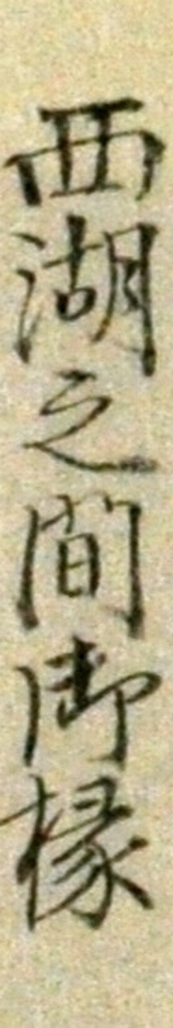西湖之間御縁
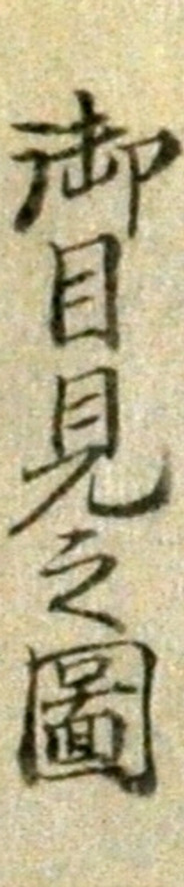御目見之図
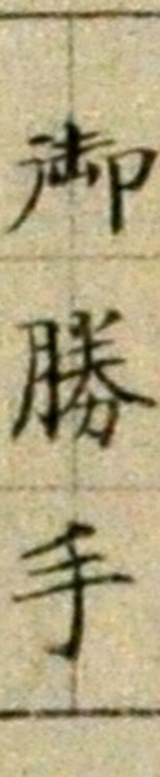御勝手
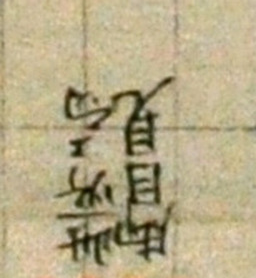御目見
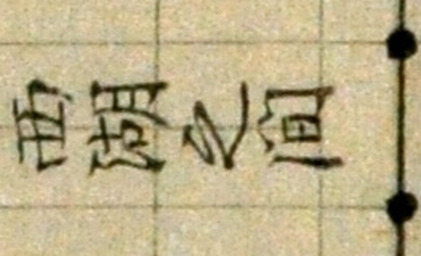西湖之間
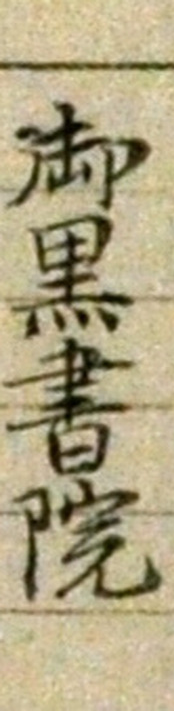御黒書院
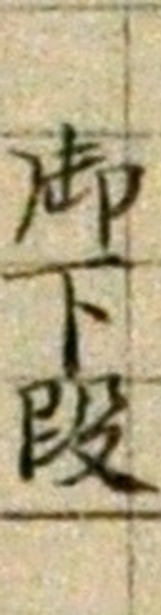御下段
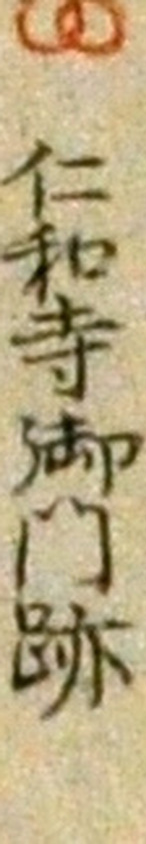仁和寺御門跡
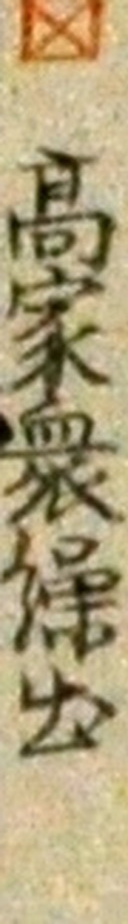高家衆繰出
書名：諸留書〔一括〕
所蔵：伊那市立高遠町図書館・合同会社AMANE
